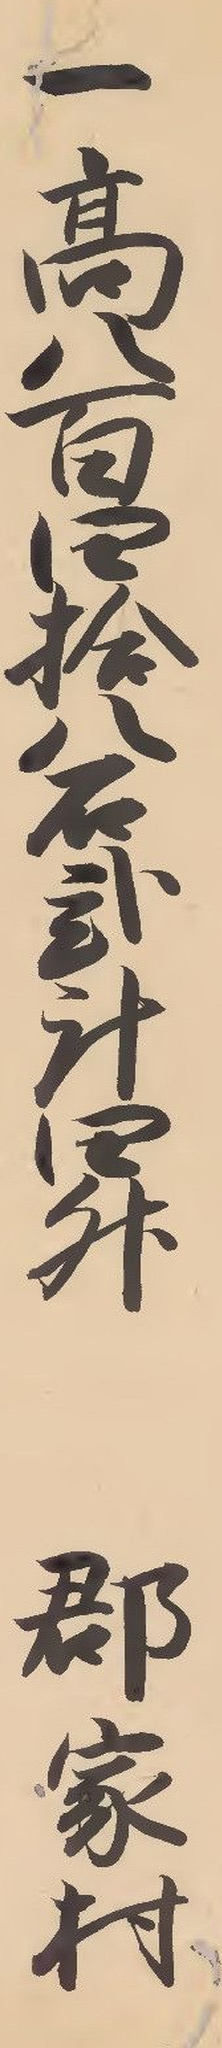一高八百四拾八石弐斗四升群家村
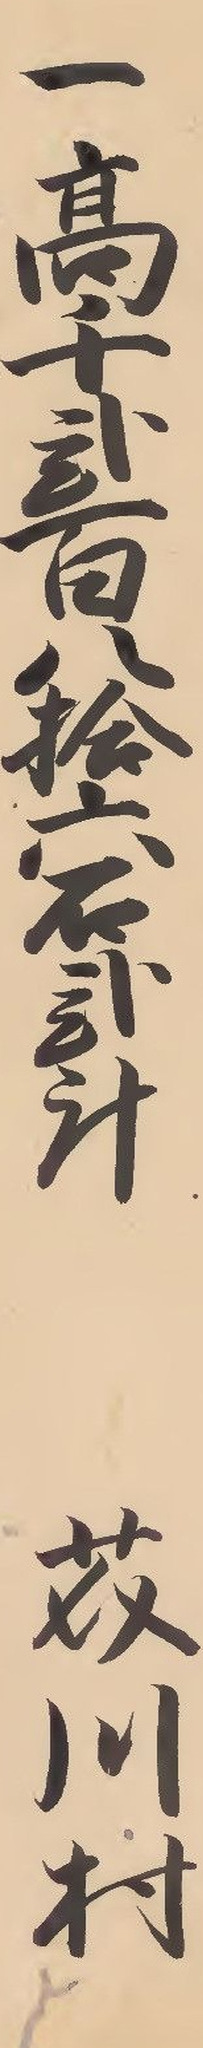一高千弐百八拾六石弐斗芥川村

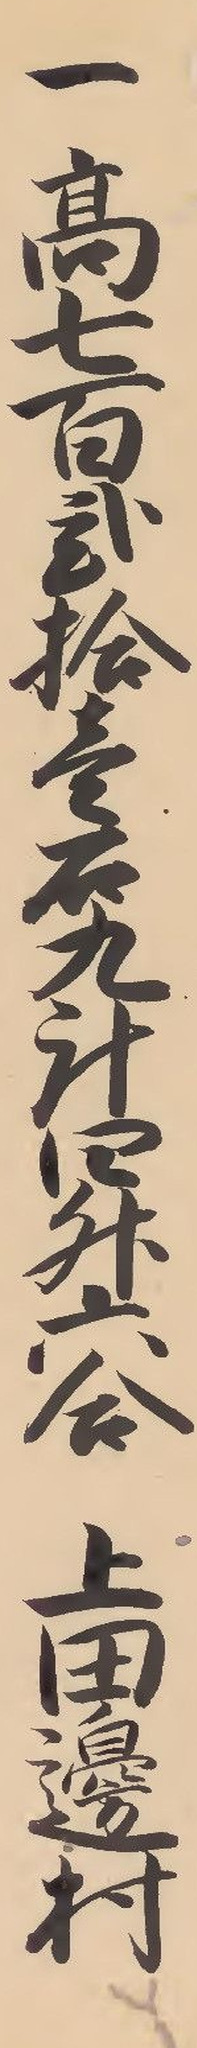一高七百弐拾壱石九斗四升六合上田辺村
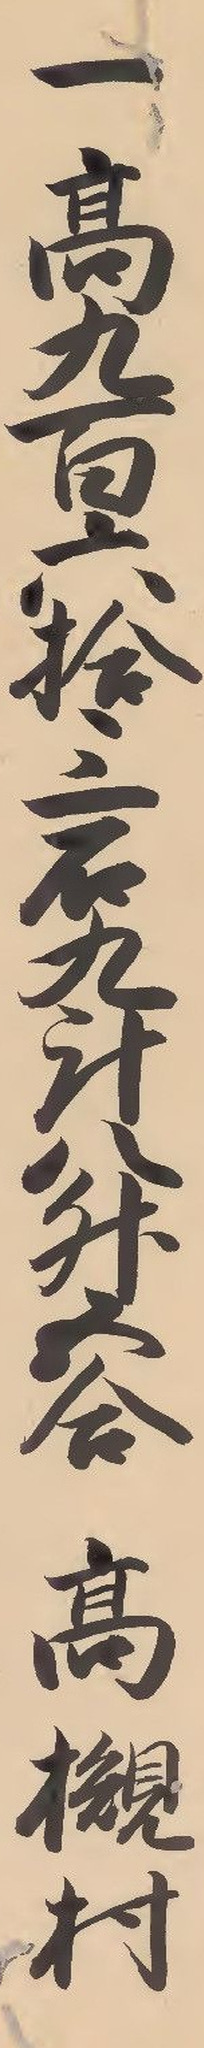一高九百六拾三石九斗八升五合高槻村
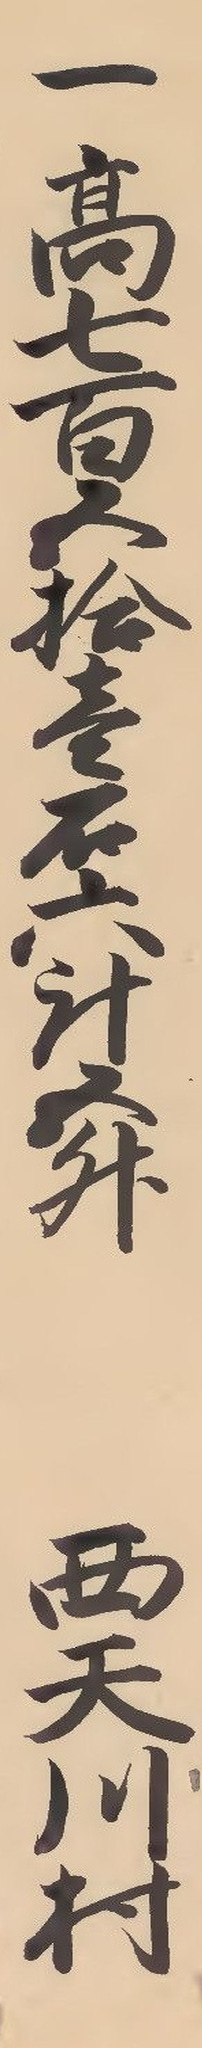一高七百五拾壱石六斗五升西天川村
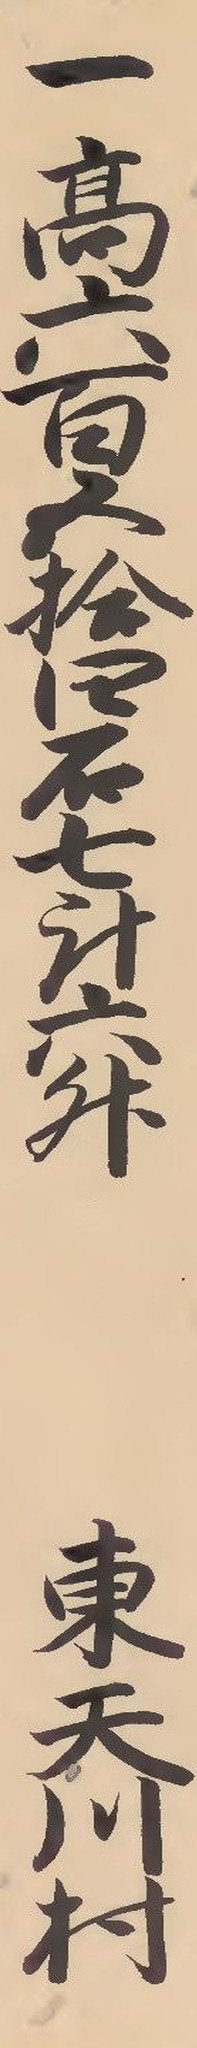一高六百五拾四石七斗六升東天川村
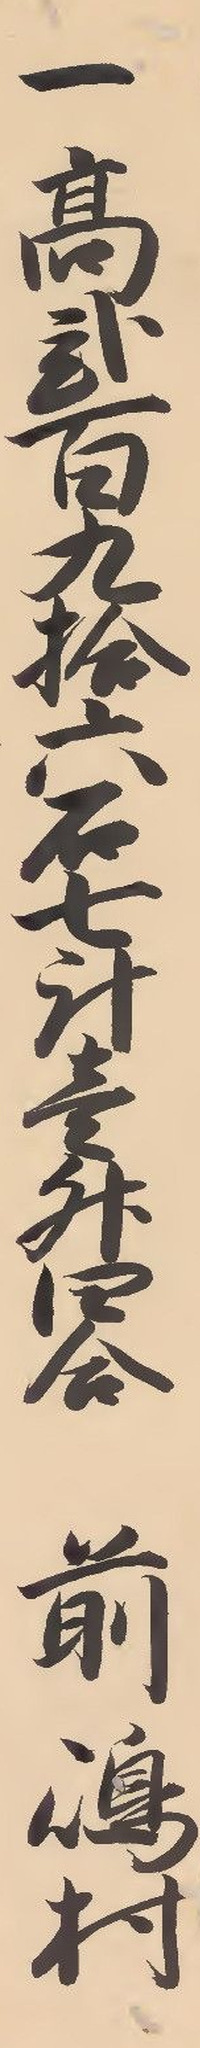一高弐百九拾六石七斗壱升四合前島村
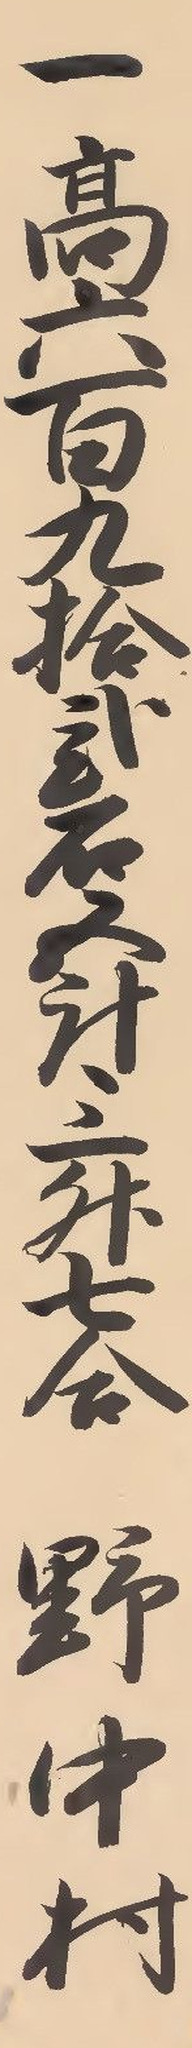一高六百九拾弐石五斗三升七合野中村
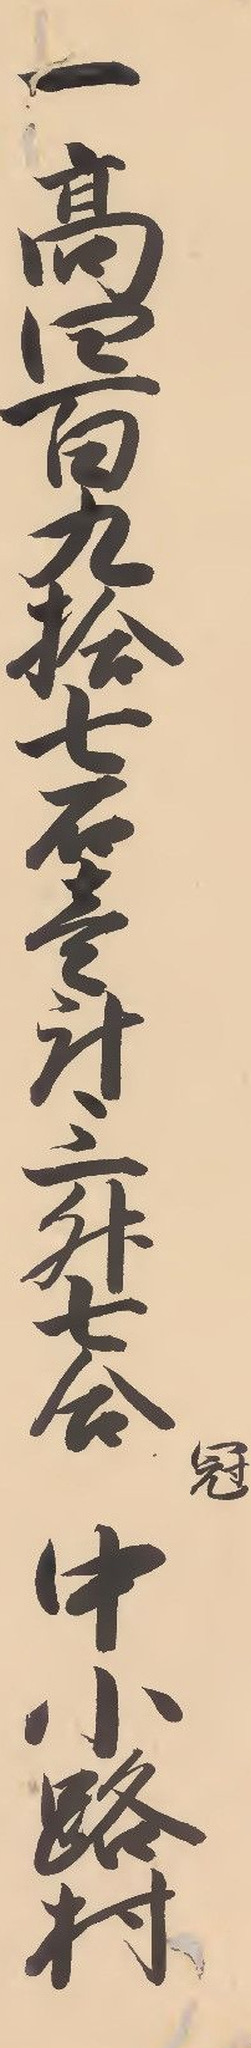一高四百九拾七石壱斗三升七合中小路村
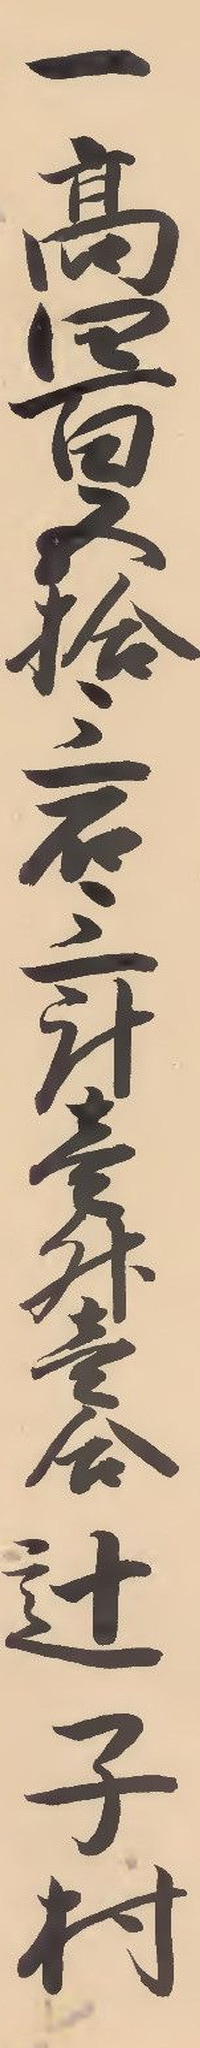一高四百五拾三石三斗壱升壱合辻子村

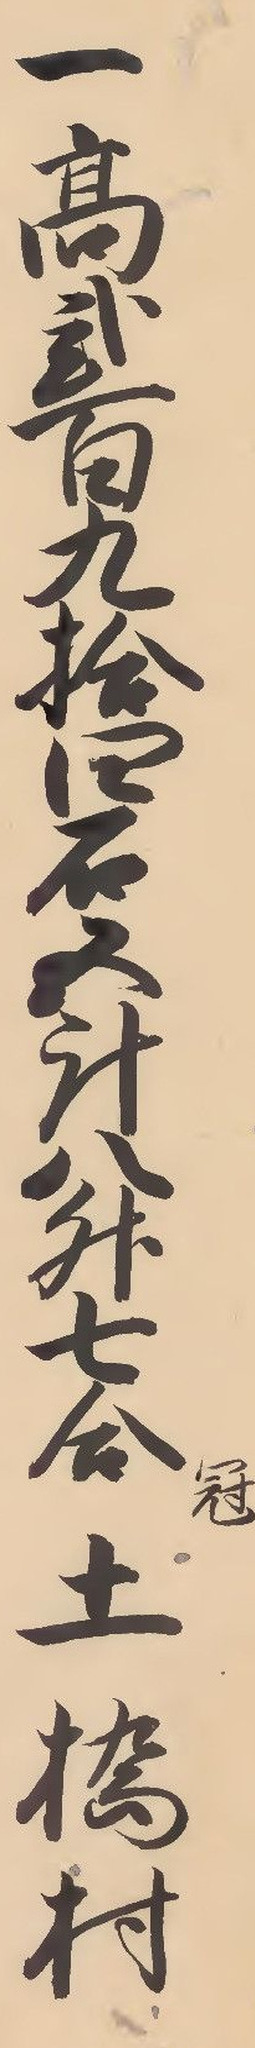一高弐百九拾四石五斗八升七合土橋村
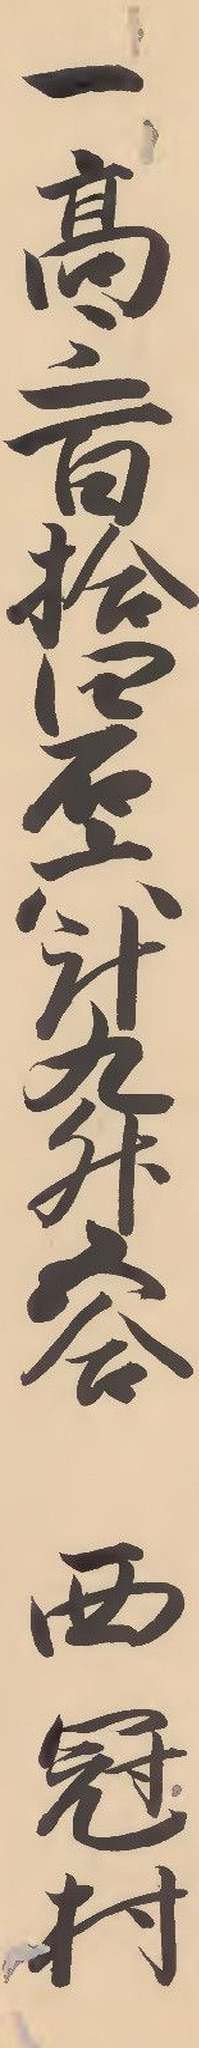一高三百拾四石六斗九升五合西冠村
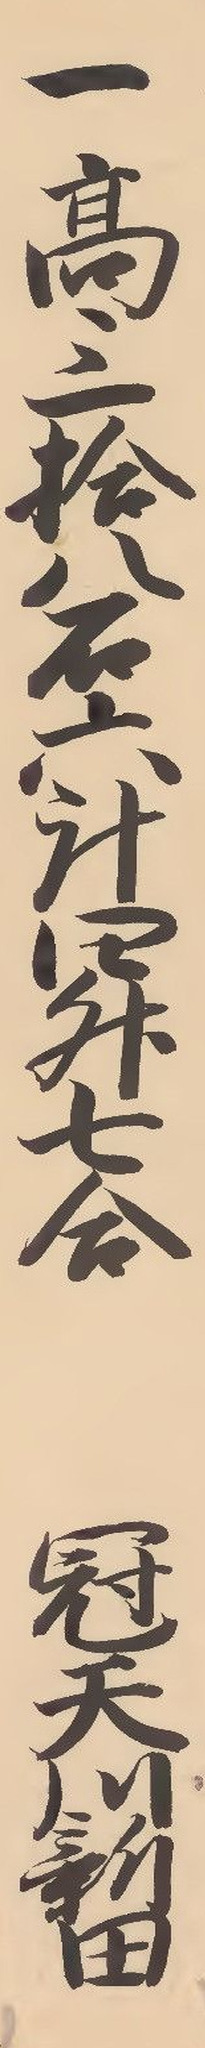一高三拾八石六斗四升七合冠天川新田
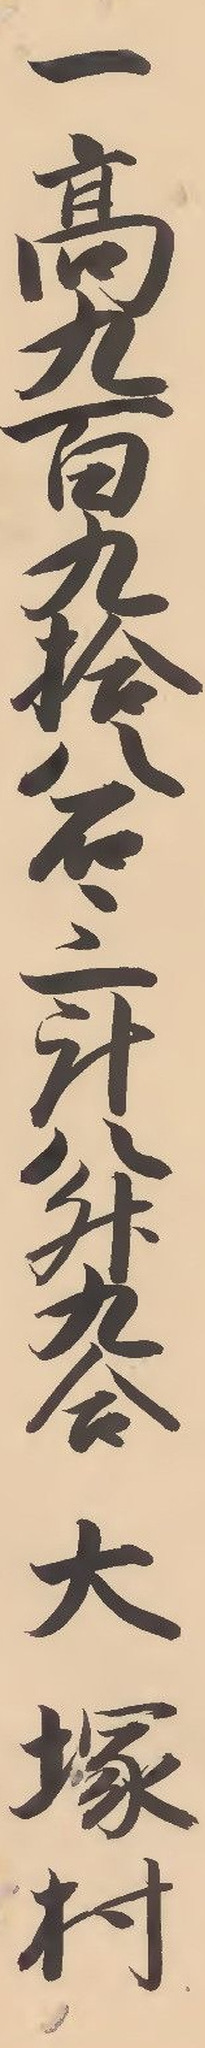一高九百九拾八石三斗八升九合大塚村
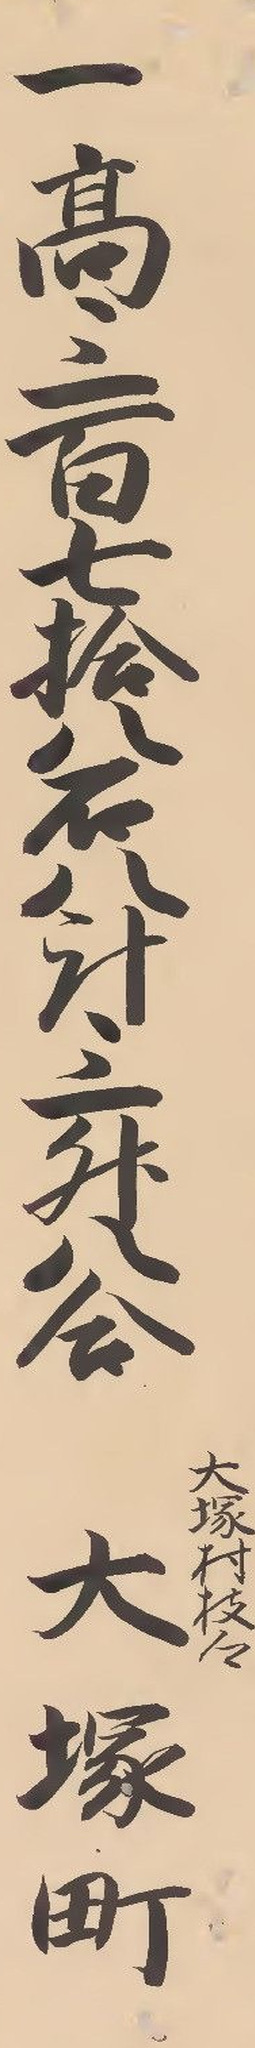一高三百七拾八石八斗三升八合大塚町
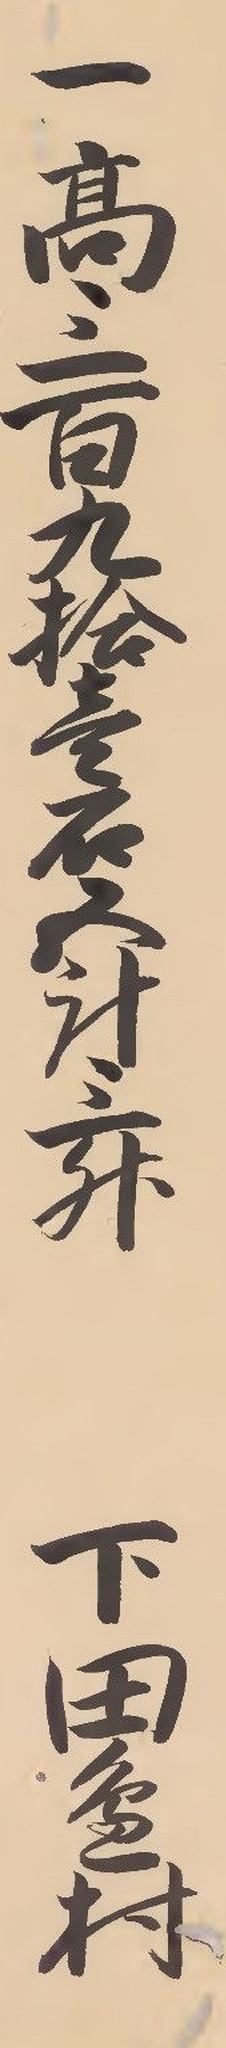一高三百九拾壱石五斗三升下田辺村
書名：摂津国郷帳
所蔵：国立公文書館 National Archives of Japan
